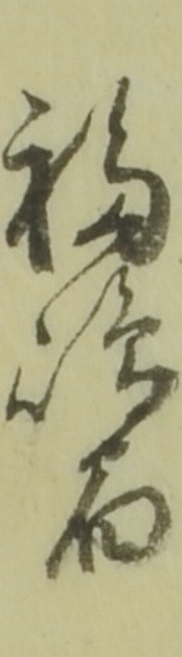福嶋宿
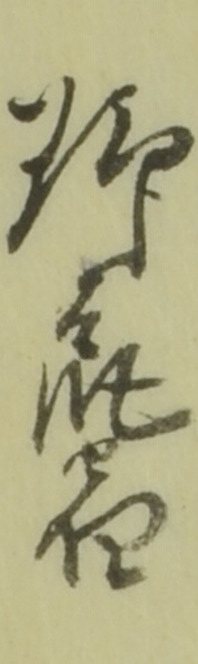野尻宿
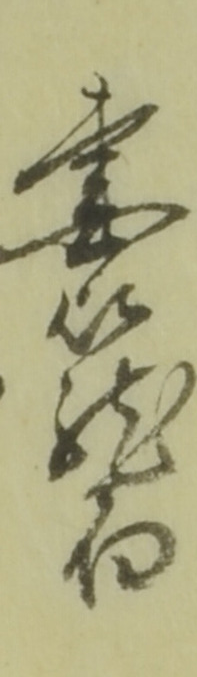妻籠宿
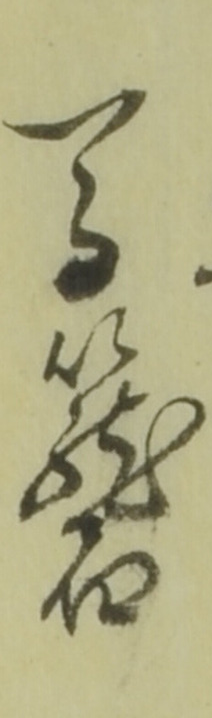馬籠宿

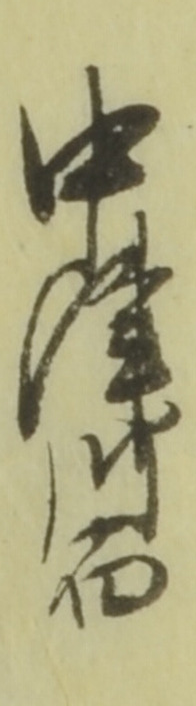中津川宿
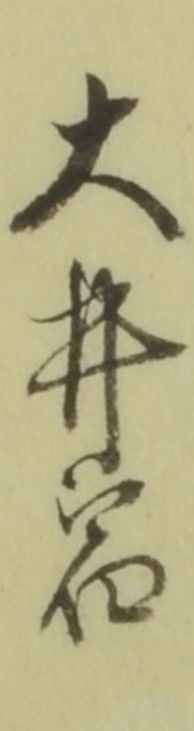大井宿
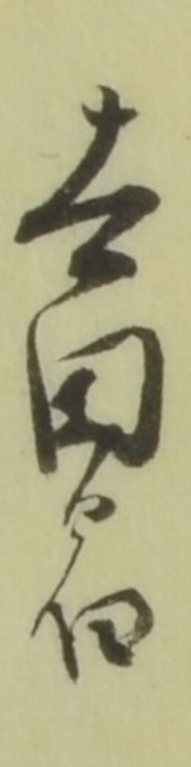太田宿
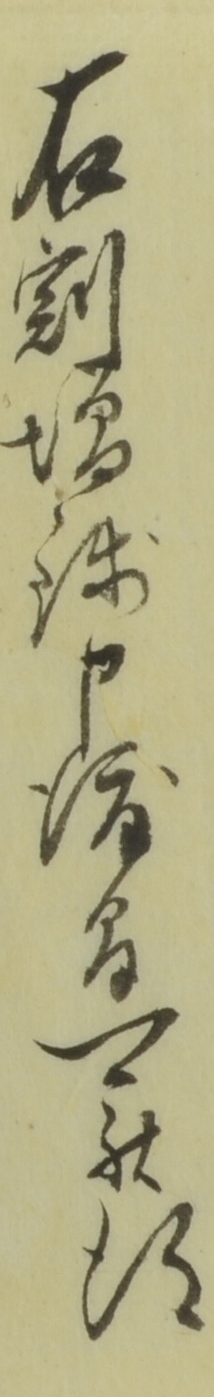右割増銭申渡間可被得
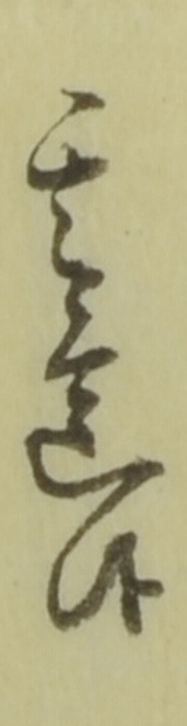其意候
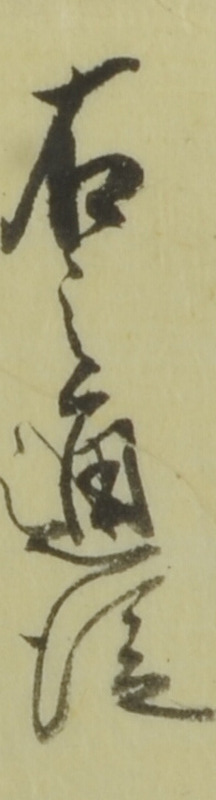右之通従
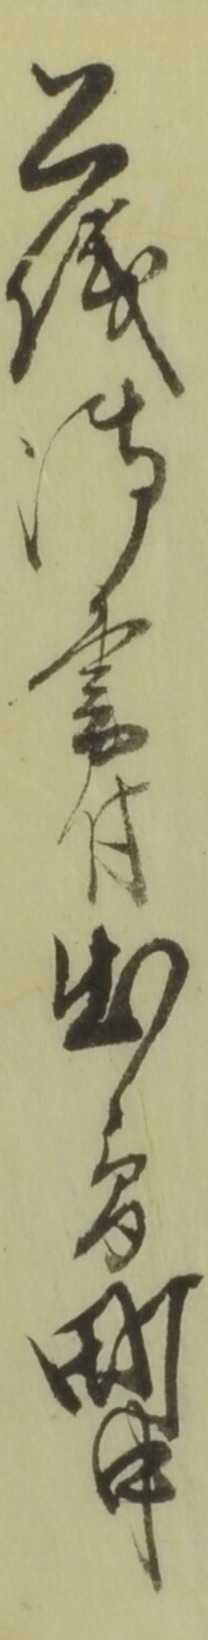公儀御書付出候間町中
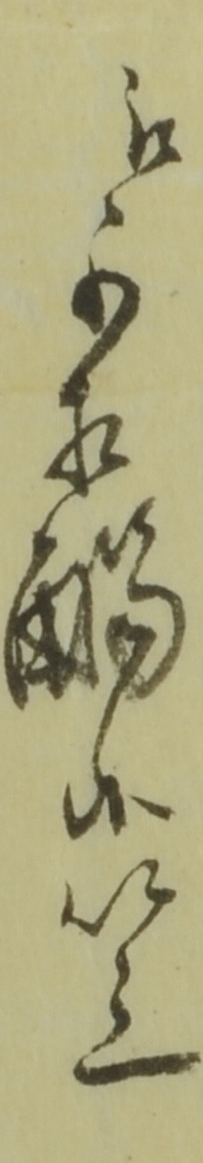江可相触候以上
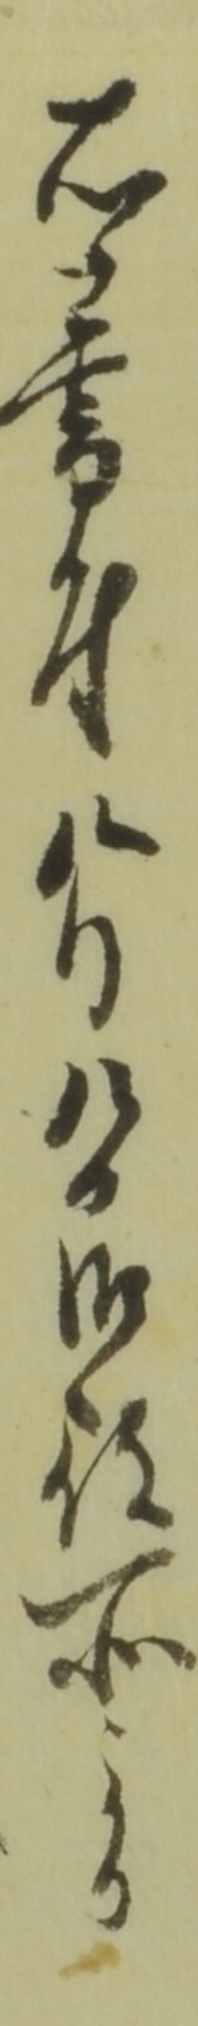右御書付八月八日御役所より
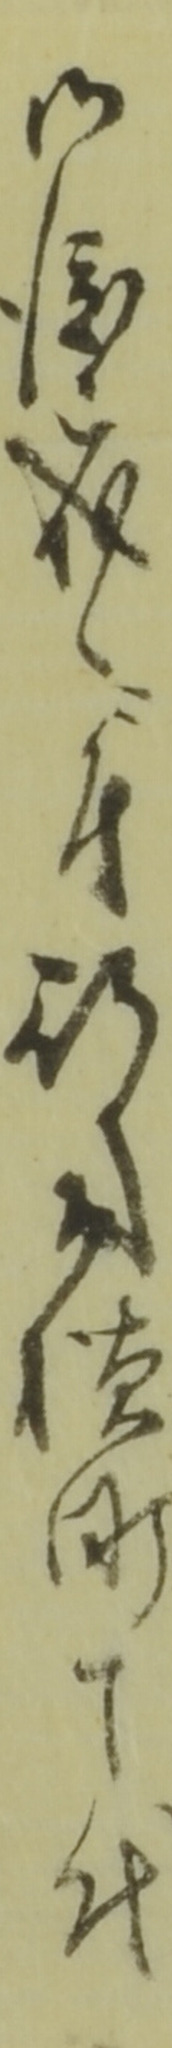御渡被成候ニ付行司横町丁代
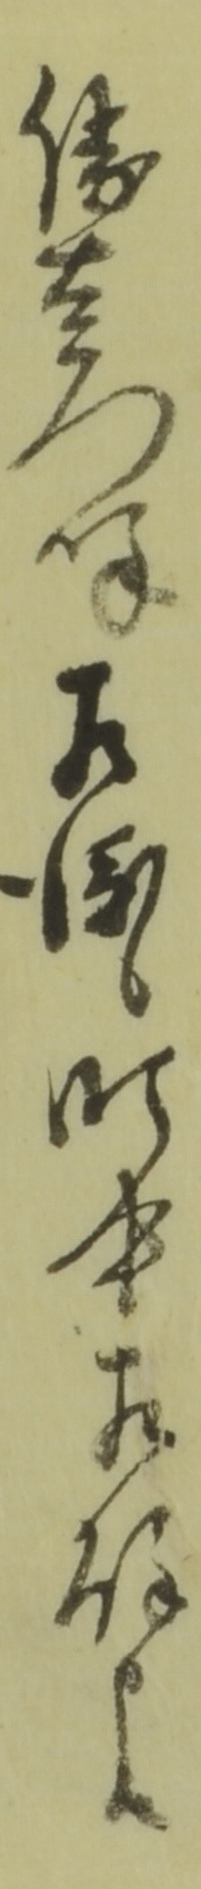勝右衛門呼相渡候町中相触申候
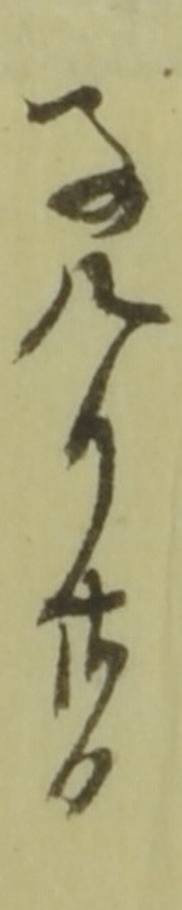子八月廿日
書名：御触書御書附控
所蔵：伊那市立高遠町図書館・合同会社AMANE
